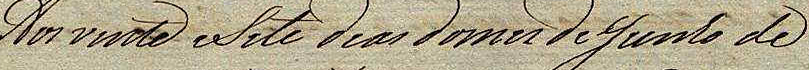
Aos vente e sete deas do mez de Junho de
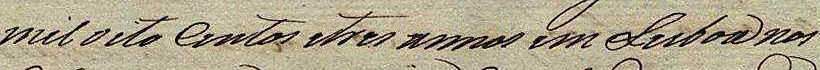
mil oitocentos e tres annos em Lisboa nos
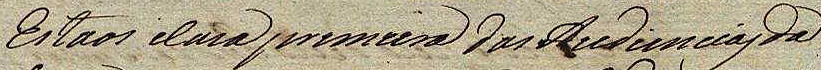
Estaos e caza primeira das Audiencias da
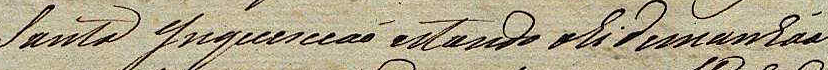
Santa Jnquesecaõ estando ahi de manhaã
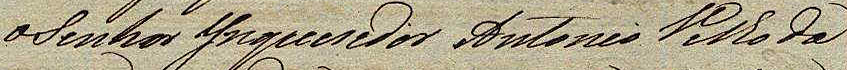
o Senhor Jnquesedor Antonio Velho da
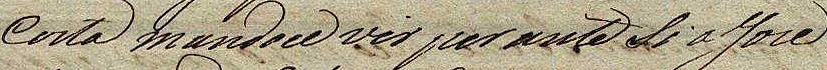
Costa mandou vir perante si a Joze
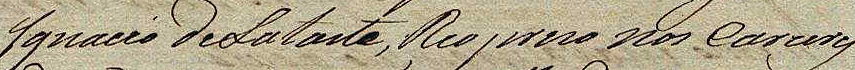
Jgnacio de Lataste, Reo prezo nos Carceres
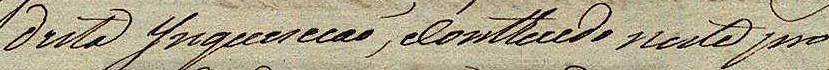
desta Jnquesecaõ, e contheudo neste pro
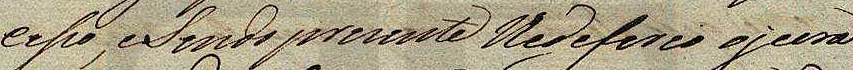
cesso, e sendo prezente lhe deferio o jura
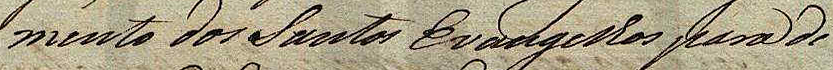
mento dos Santos Evangelhos para di
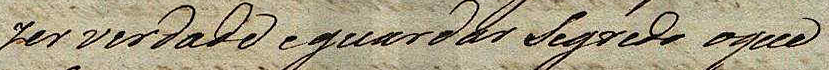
zer verdade e guardar segredo o que
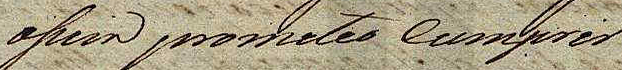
assim prometeo cumprir.
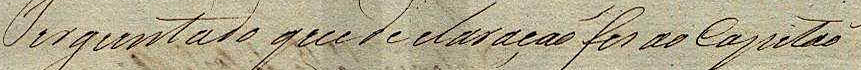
Perguntado que declaraçaõ fes ao Capitaõ
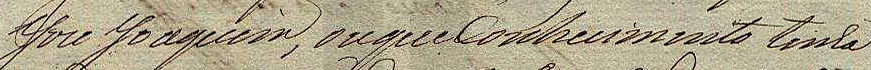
Joze Joaquim, ou que conhecimento tenha
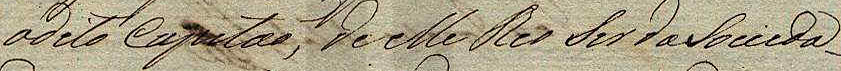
o dito Capitaõ, de elle Reo ser da Socieda
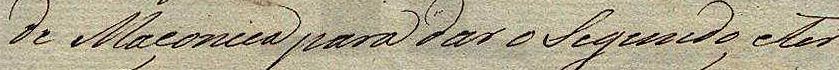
de Maçonica para dar o segundo e ter
